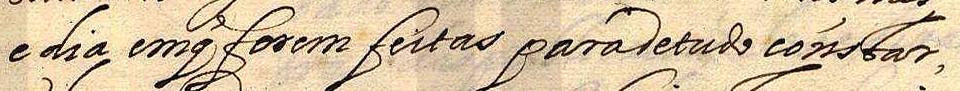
e dia em q̄ forem feitas para de tudo constar,
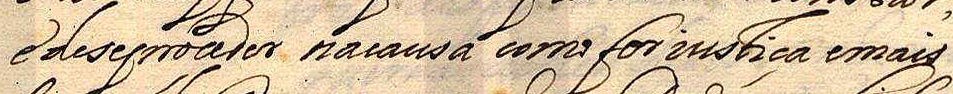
e de se proçeder na causa como for iustiça e mais
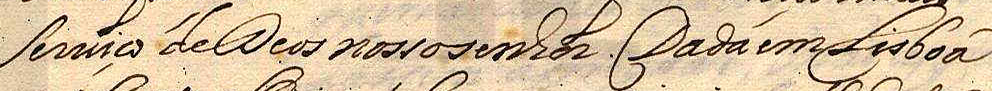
seruiço de Deos nosso senhor. Dada em Lisboa
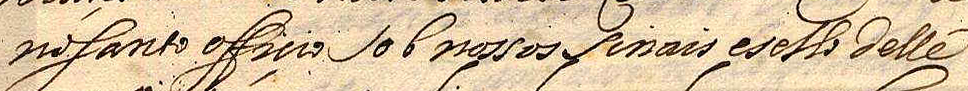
no santo offiçio sob nossos sinais e sello delle
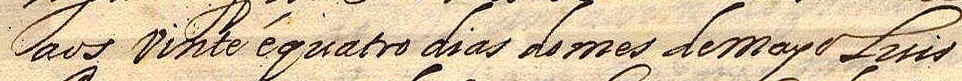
aos vinte e quatro dias do mes de mayo Luis
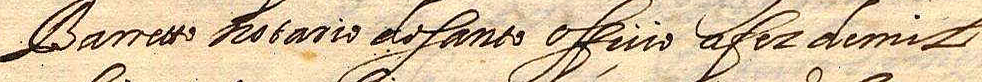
Barretto notario do santo officio a fez de mil
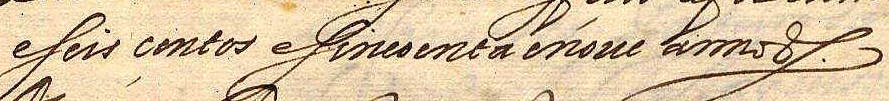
e seisçentos e sincoenta e noue annos.
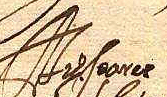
Alv.o Soares
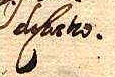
de Castro.
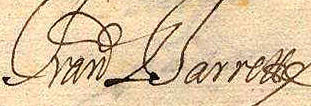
Fran.co Barretto
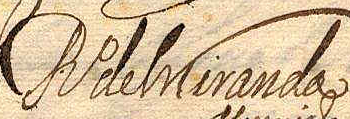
Ro de Miranda
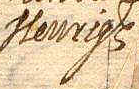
Henriq̄s
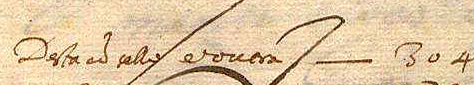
Desta cō sello e outra - 304
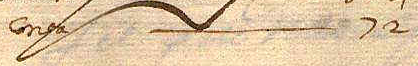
Conta - 72
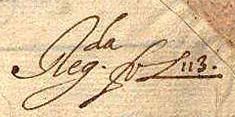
Reg.da fol 113.
